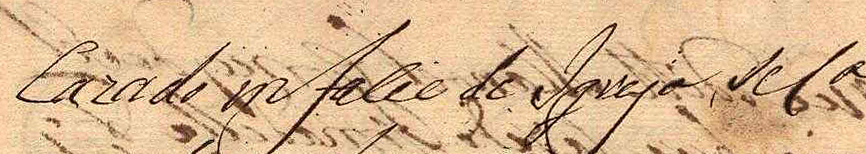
Cazado in faCie de Igreja, se ca
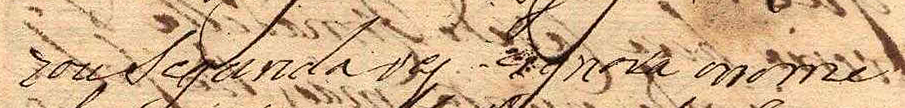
zou Segunda ves ignora o nome
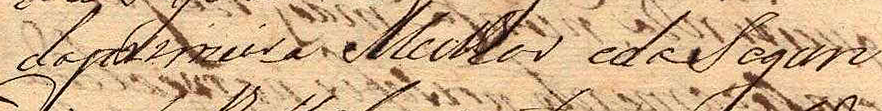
da primeira Mulher e da Segun
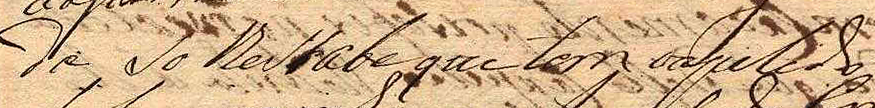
da só lhes sabe, que tem o apelido
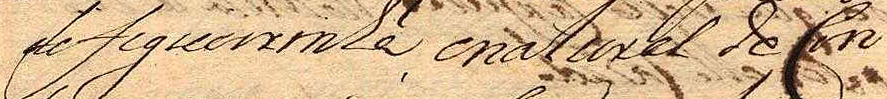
de fegueixinha, e natural de Cin
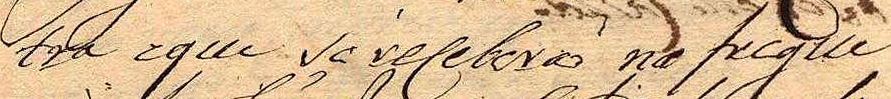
tra e que se reCeberaõ na fregue
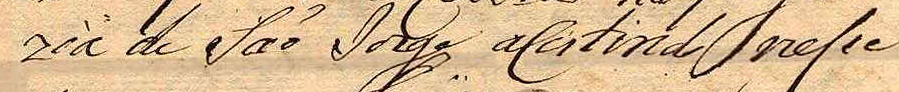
zia de Saõ Iorge aCestindo nesse
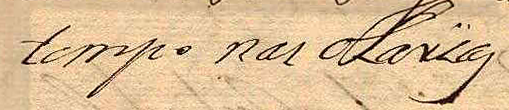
tempo nas olarias
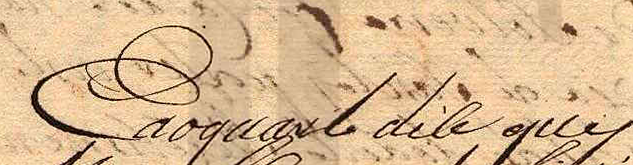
E ao quarto dice que
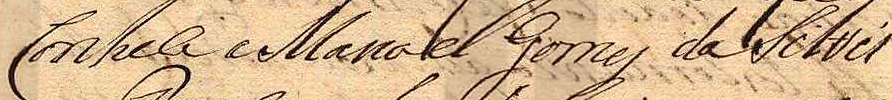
Conhece a Manoel Gomes da Silvei
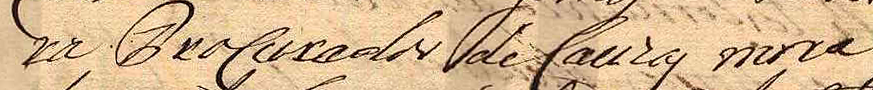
ra ProCurador de Cauzas mora
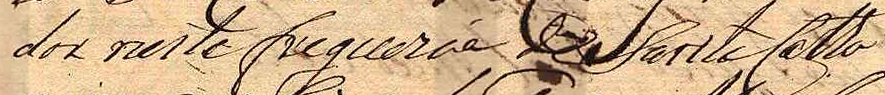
dor nesta freguezia da Santa Catha
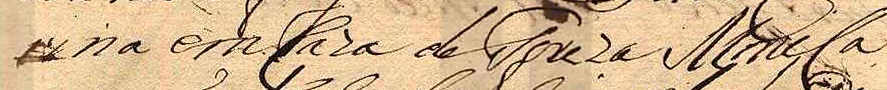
rina em Caza de Tereza MoniCa
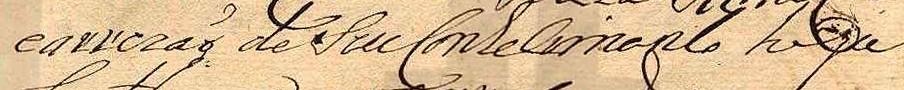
e a rrezaõ de seu Conhecimento he pe
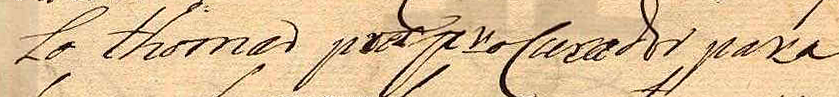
Lo thomar por proCurador para
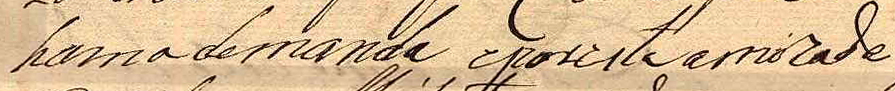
huma demanda, e por este amizade
